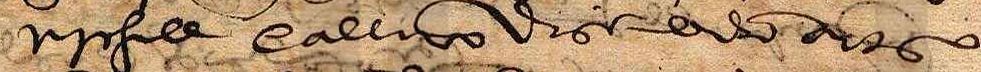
njchell e all n̄o dise do dtō arto
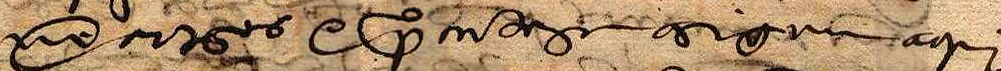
nē artos e p̄o certeza asignou aquj
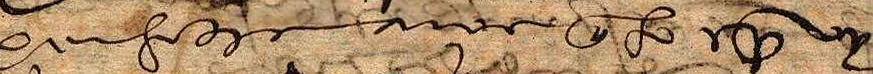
e eu djo trauaços q̄ ho esp̄vy
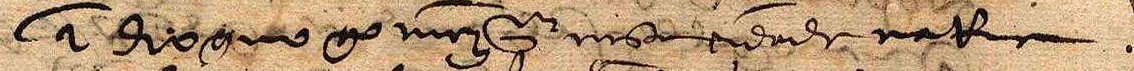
item dioguo gomez mor nesta cidade na Rua
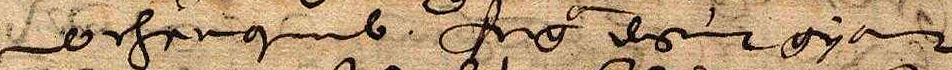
do cham queimado frega de sam gyam
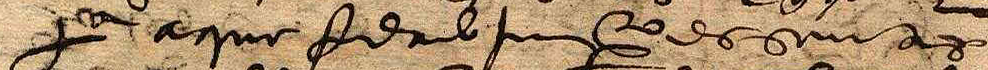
ta a que foi dado Juramto dos santos
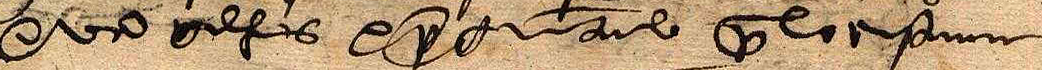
evāgelhos e p̄gūtado p̄lo custume
